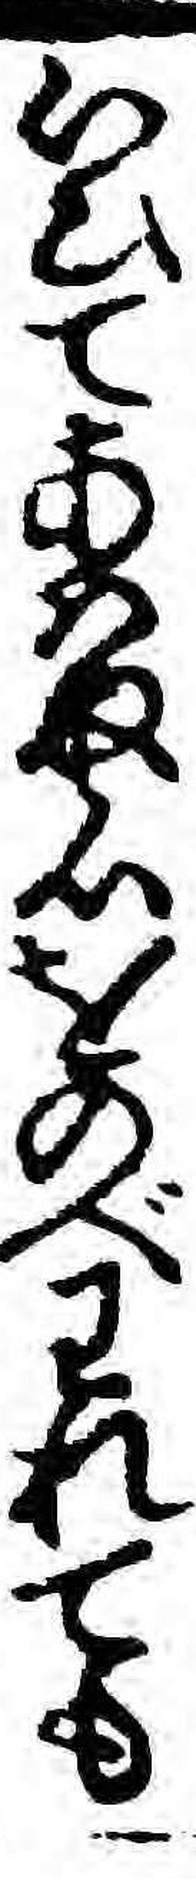いひてあはぬ心をのべわれても
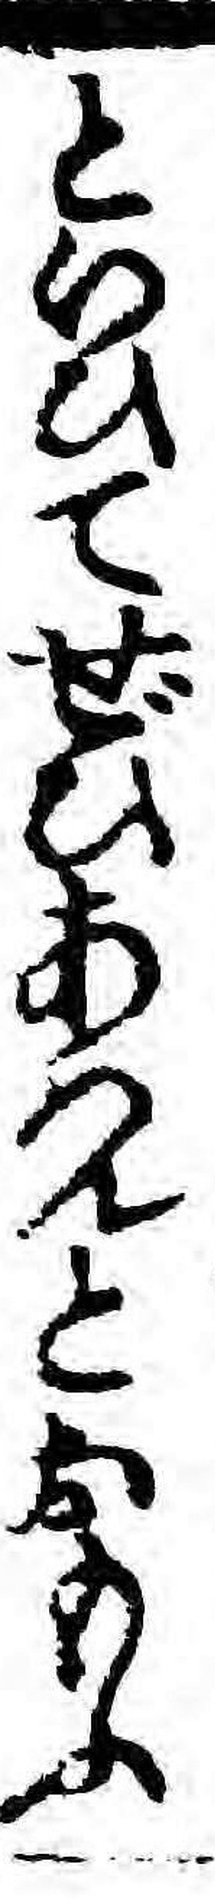といひてぜひあはんとおもふ
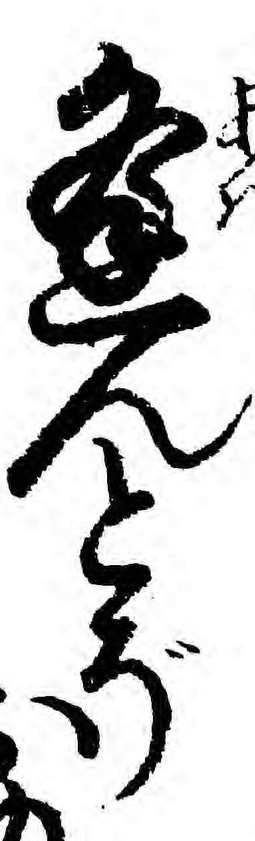逢んとぞ
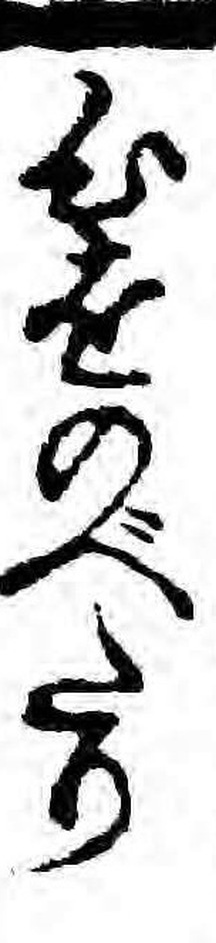心をのへたり
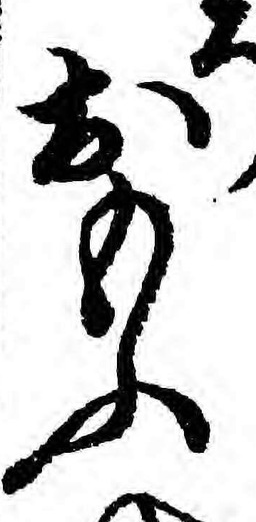おもふ

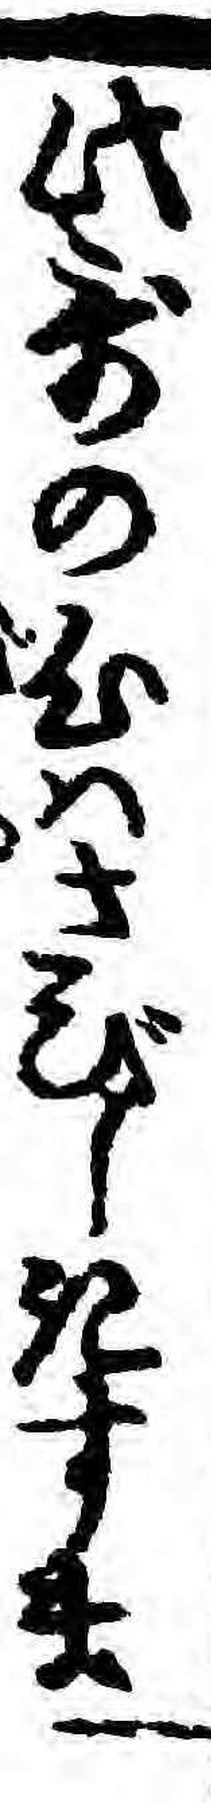此哥の心はさびしきすま
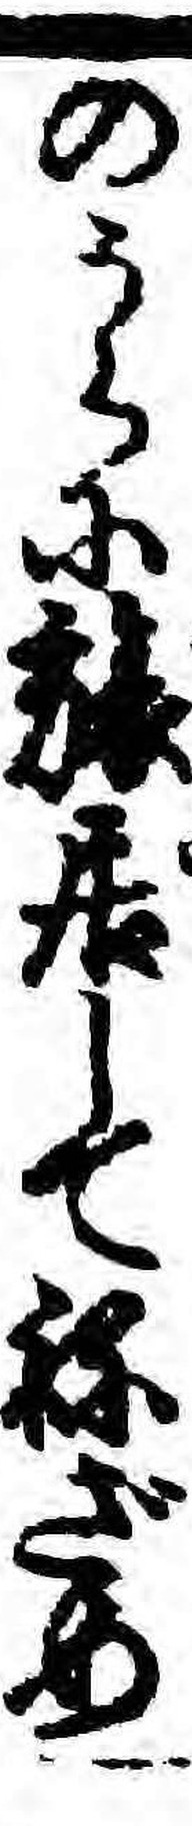のうらに旅居してねざめ
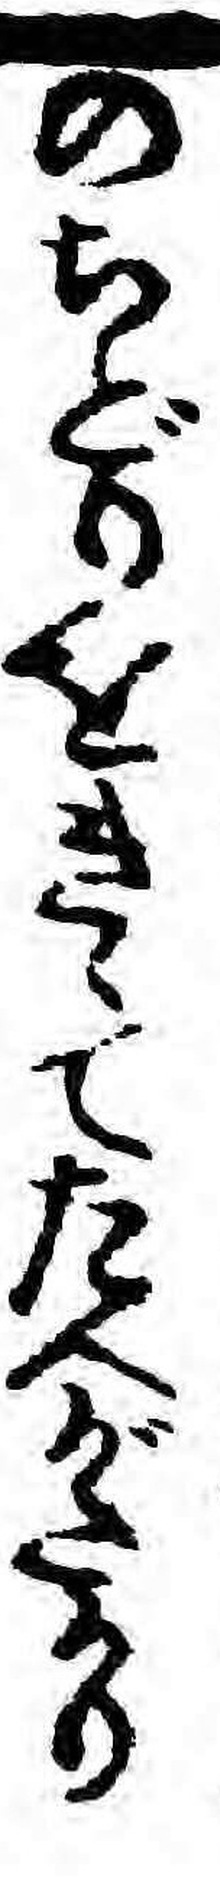のちどりをきゝてたへがたかり
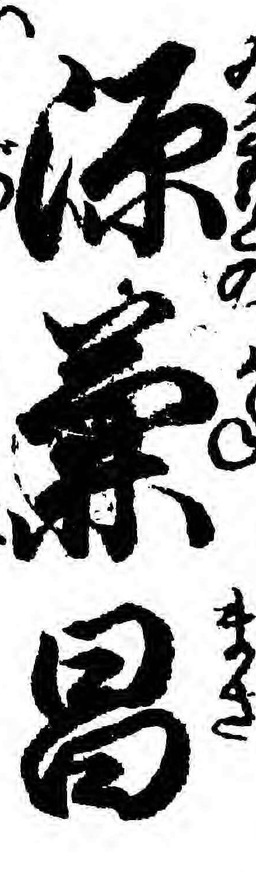源兼昌
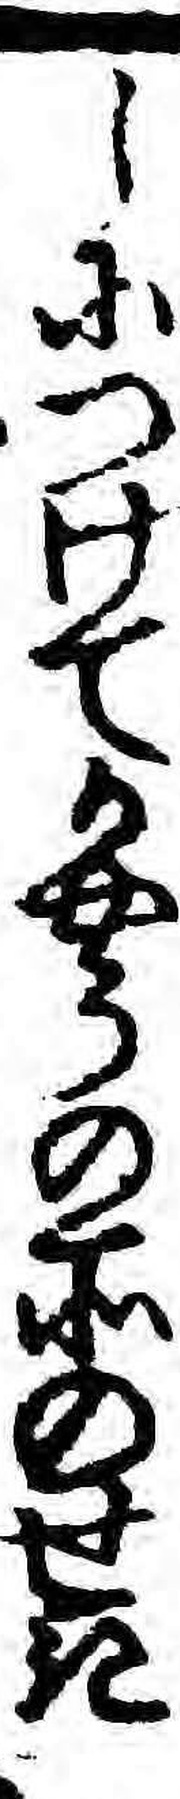しにつけてかやうの所のせき
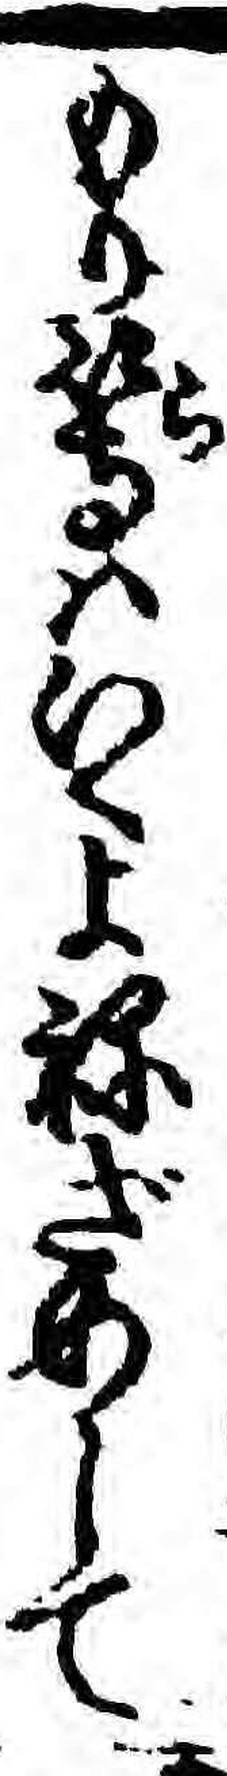もり等はいくよねざめして
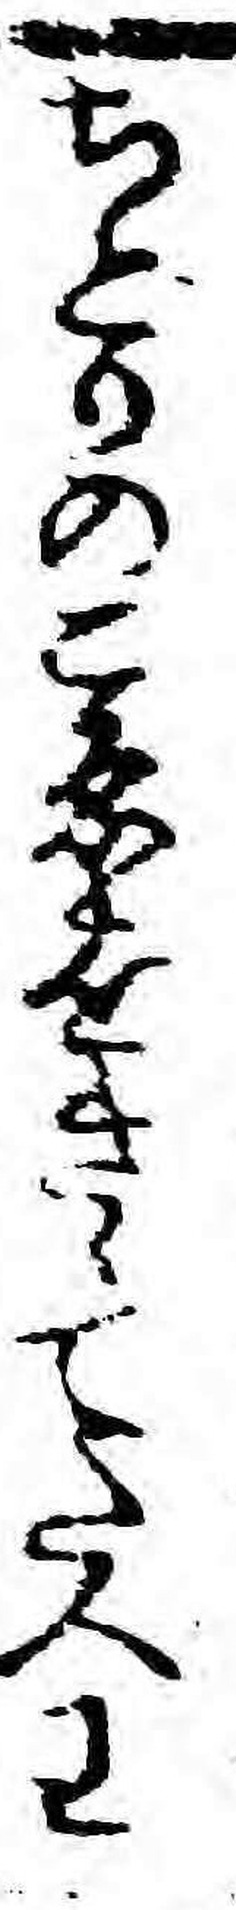ちどりのこゑをきゝてたへわ
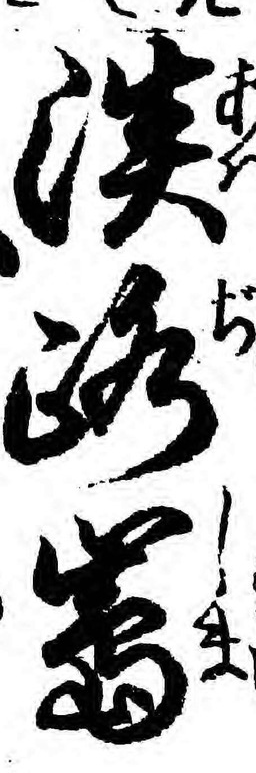淡路島
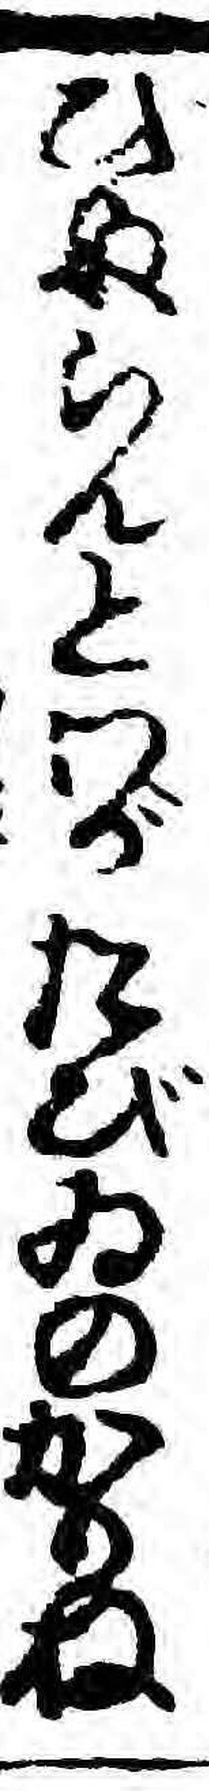びぬらんとわがたびゐのかりね
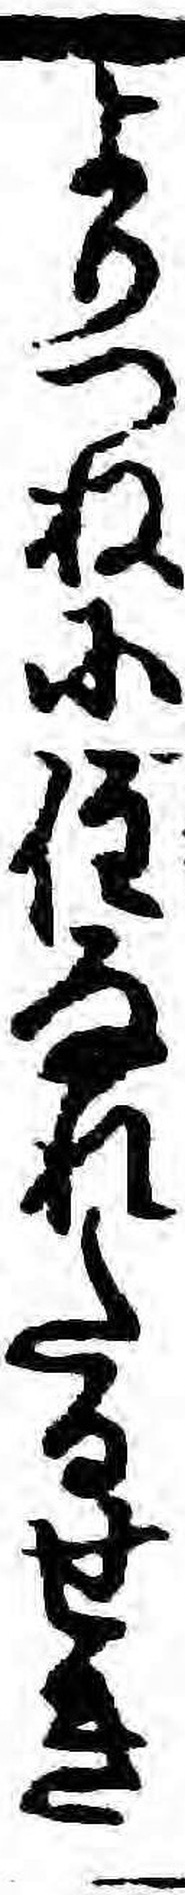よりつねに住なれたるせき
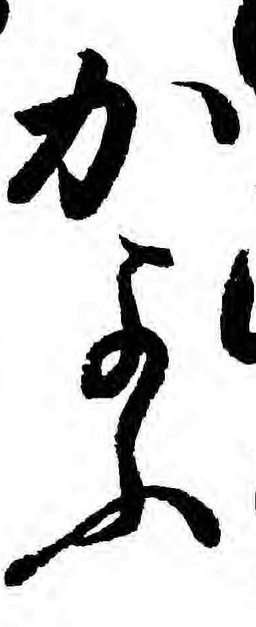かよふ
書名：頭書和歌注譯／壽賀多百人一首小倉錦
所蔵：国文学研究資料館
